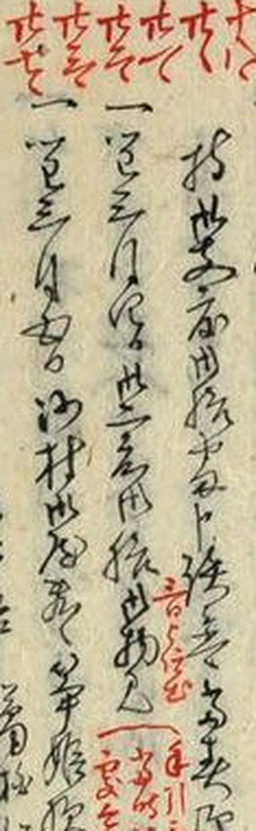一閏三月四日御二度御膳御物見
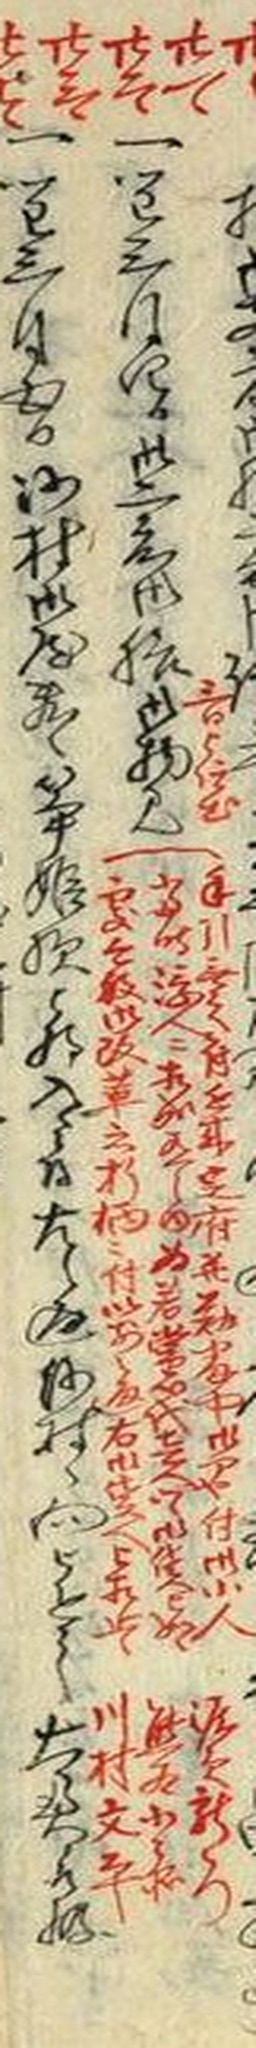一閏三月五日砂村御屋敷へ箏姫様被為入候ニ付左之通砂村へ向被進之大奥取扱
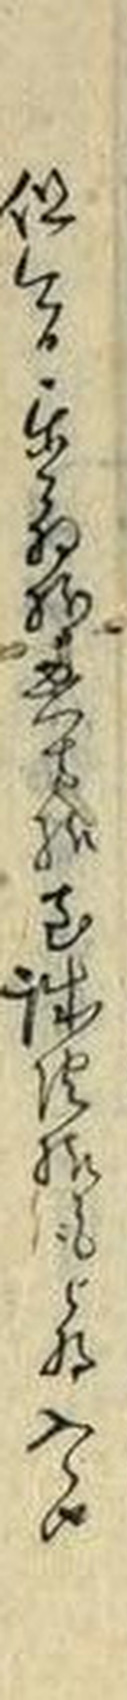但今日楽翁様奥方様至誠院様も被為入候由

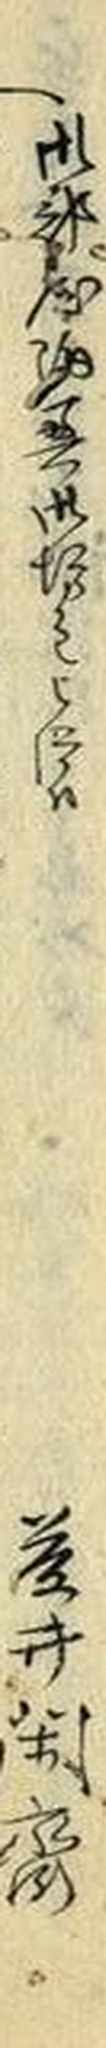御部屋附奥御坊主被仰付藤井閑齊
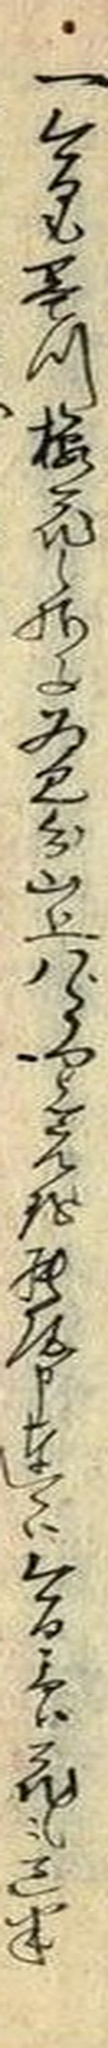一今日も墨川桜花之様子為見分山上八郎右衛門差越罷帰申達候ハ今日ニ而ハ花も過半
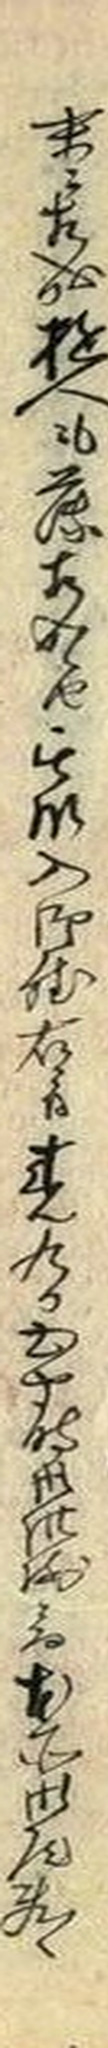末ニ相成遊人も薄相成候由其段入御聴右ニ付来ㇽ九日五半時御供揃ニ而本所御屋敷へ
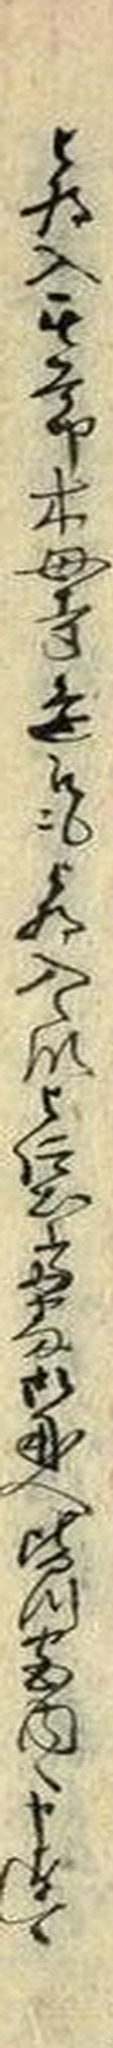被為入其節木母寺辺江も被為入候段被仰出当番御用人皆川宮内へ申達候
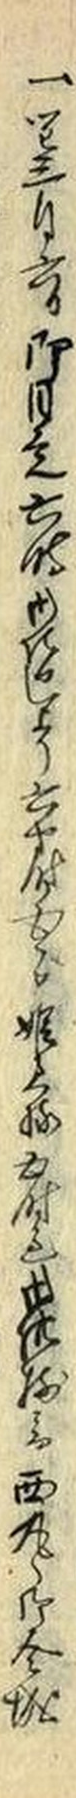一閏三月六日御目覚六時御仕廻上り六半時五分姫君様五時過御供揃ニ而西丸へ御登城
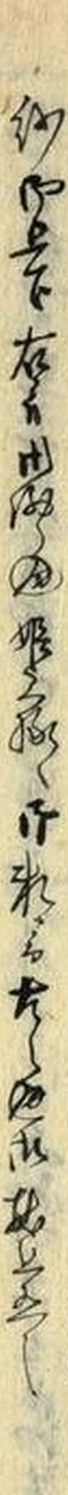紗御上下右ニ付御例之通姫君様へ御頼ニ而左之通御献上有之
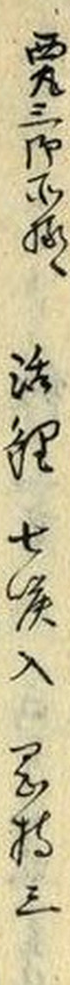西丸三御所様へ活鯉七喉入岡持三
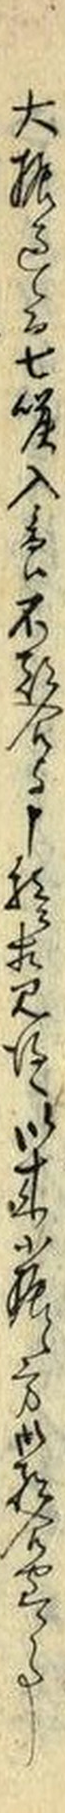大振過候而七喉入ニ而ハ不都合と申様ニ相見得候以来小振之方御都合宣候事
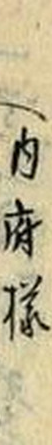内府様
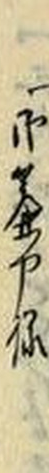御簾中様
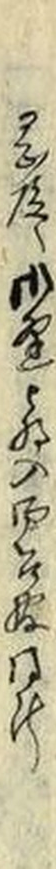岡殿へ御逢被為入御召服同断
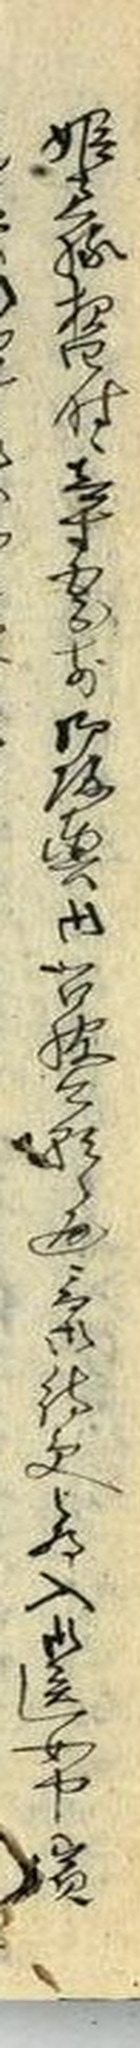姫君様夜四時へ壱寸五分前御帰輿御召服今朝之通ニ而御待受被為入御送女中浜
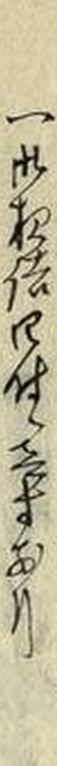一御夜詰四時へ壱寸前引
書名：少傅日録抄（斉承付側向頭取日記、在府）
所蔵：福井県文書館 Fukui Prefectural Archives
